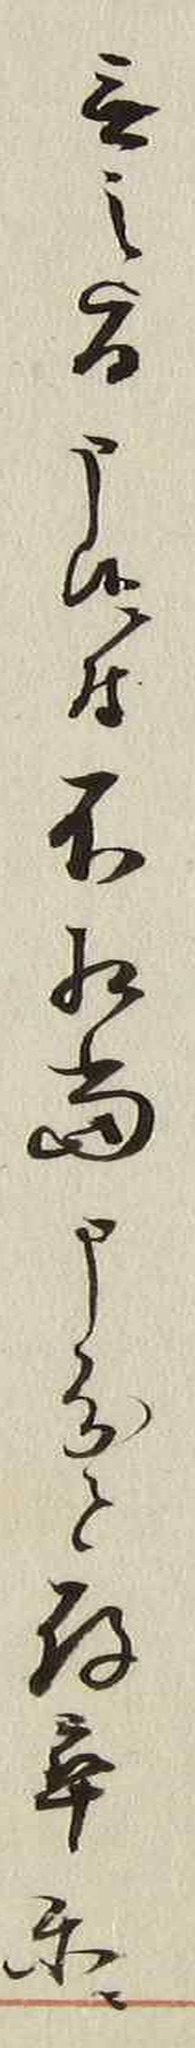無之旨申候ニ付不相当申分と存卒爾ニ
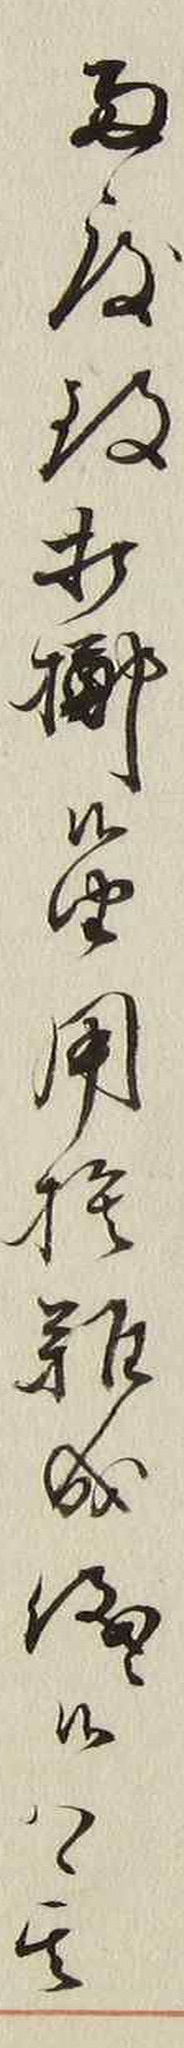両度致打擲候由用捨難成儀ニ候ハヽ其
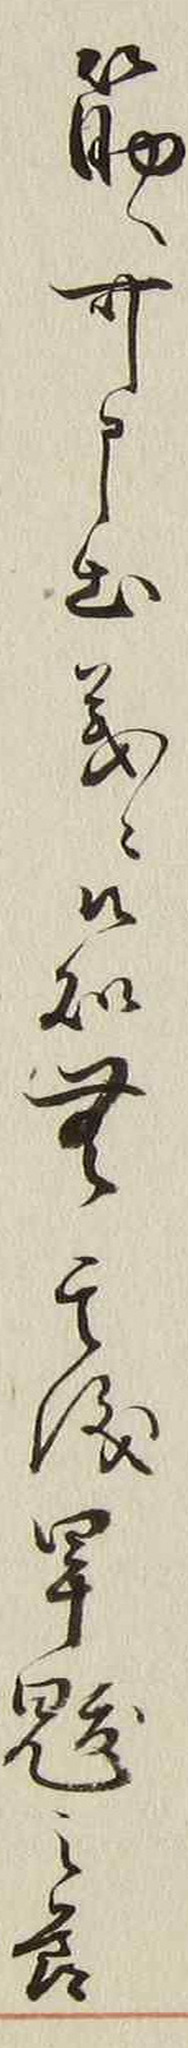筋ヘ可申出義ニ候処無其儀旱魃之節
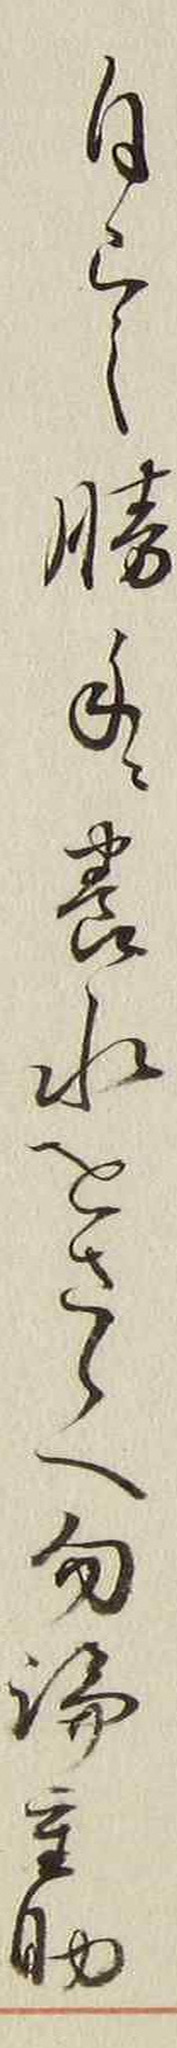自分勝手ニ養水をさらへ勿論重助
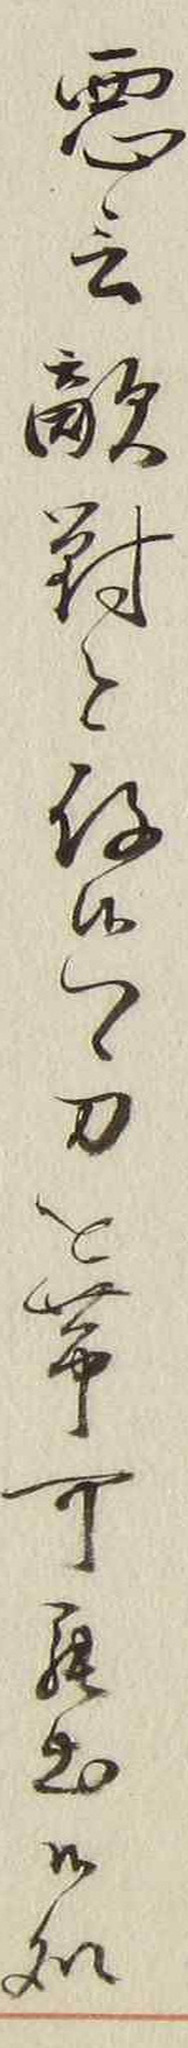悪言敵対と存候ハヽ刀を帯可罷出候処

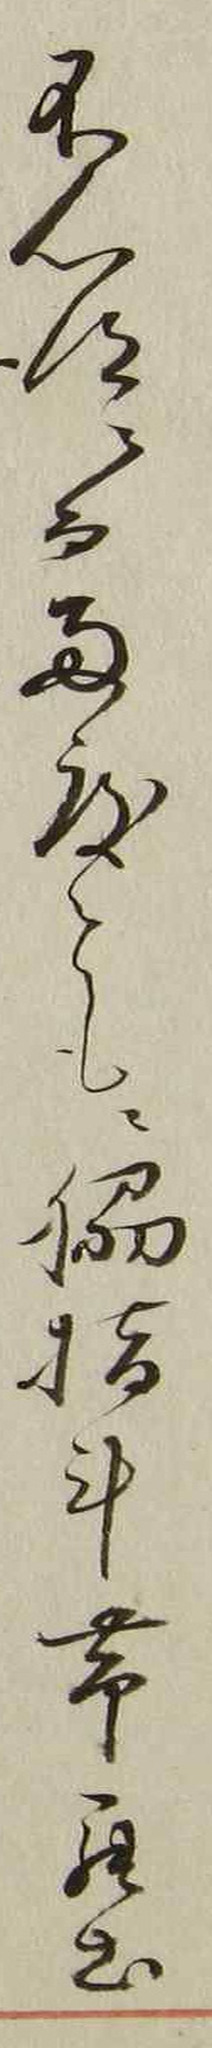不心得ニ而両度とも脇指計帯罷出
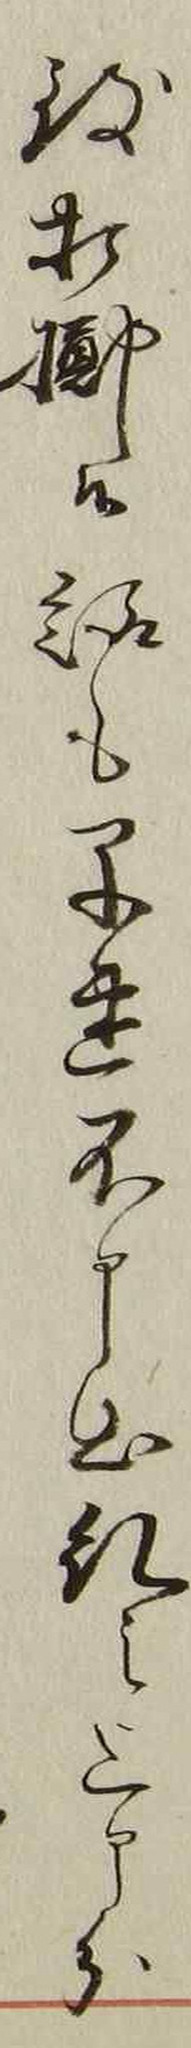致打擲候趣も早速不申出糺之上申分
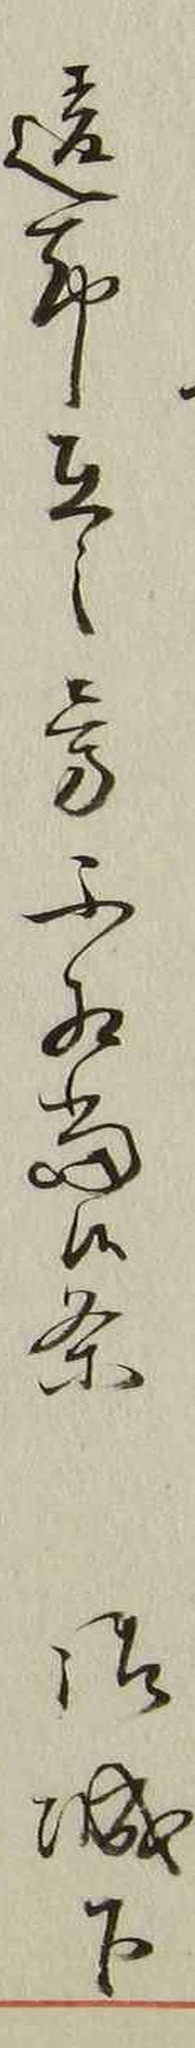違却在之旁不相当候条御城下
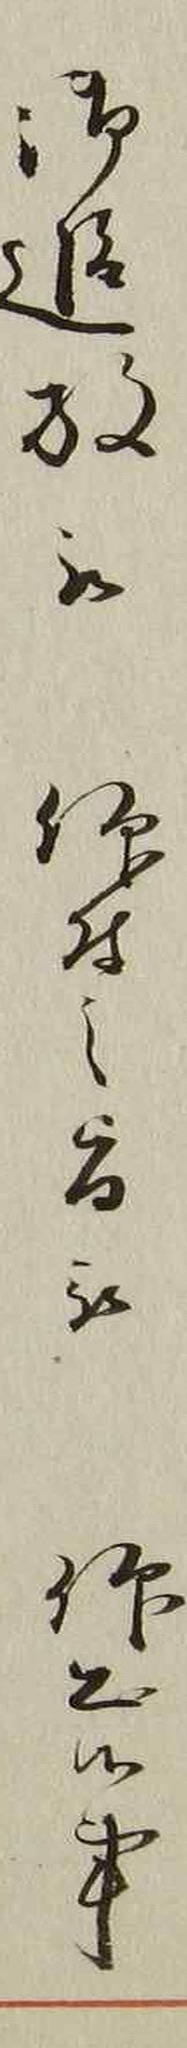御追放被仰付之旨被仰出候事
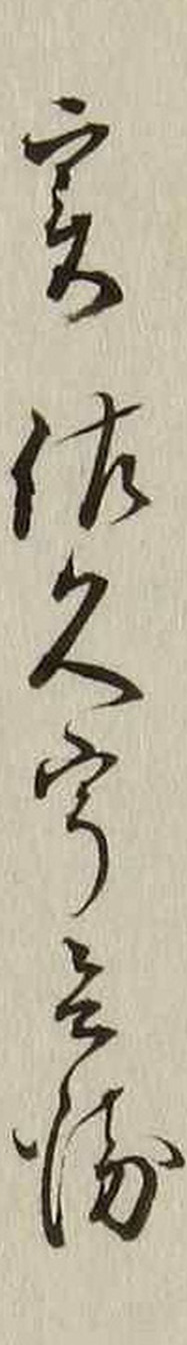実佐久宇兵衛
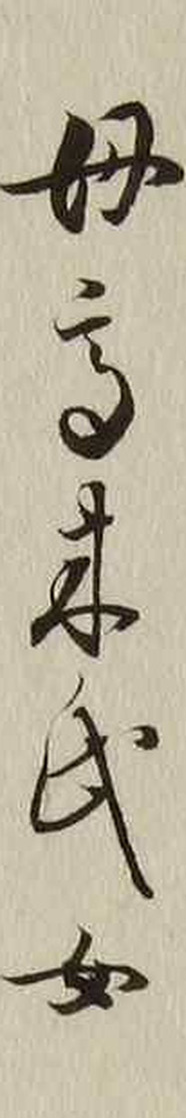母高木氏女
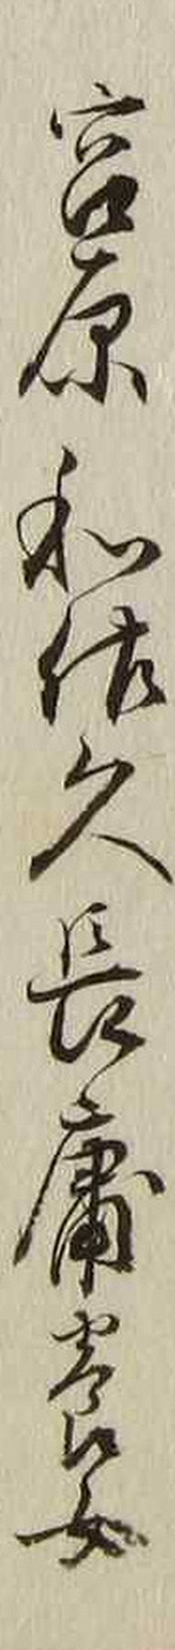宮原和佐久長庸養女
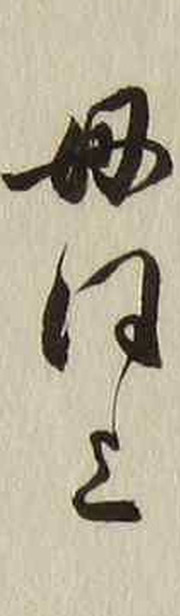母同上

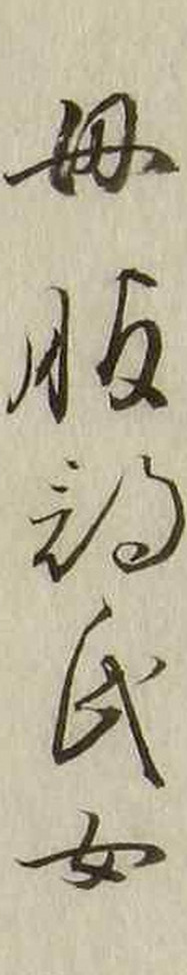母服部氏女
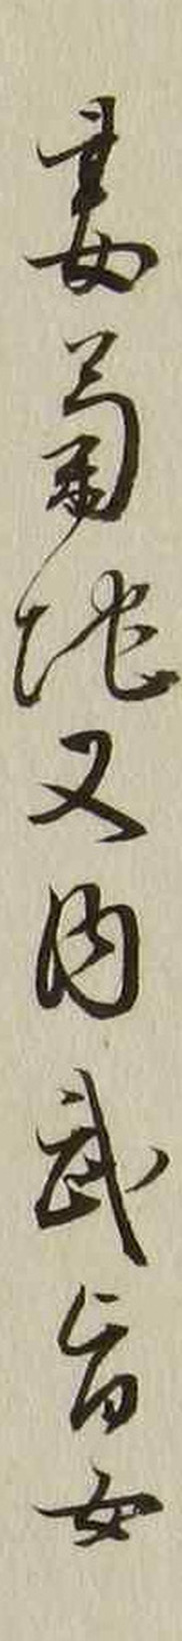妻菊池又内武旨女
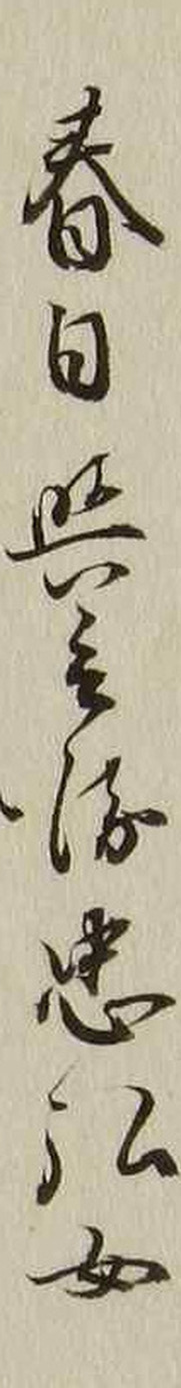春日与兵衛忠弘女
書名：諸士系譜　巻之26　い之部26
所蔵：会津若松市立会津図書館
